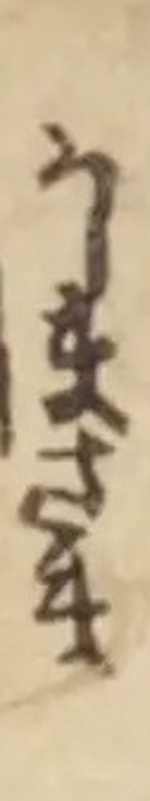かしまさま
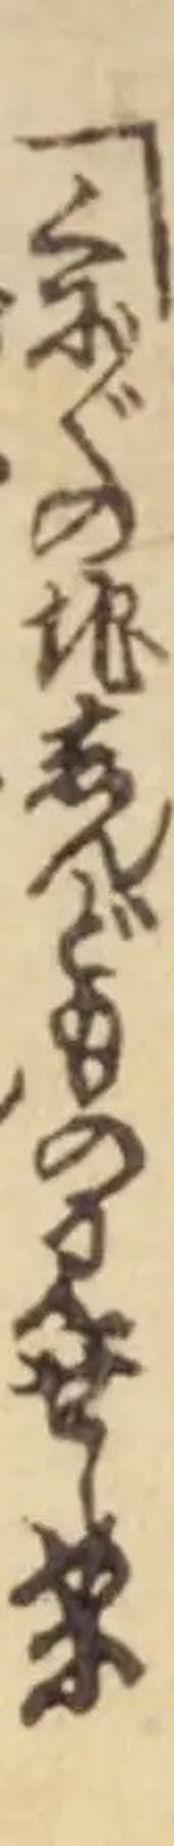「くに〴〵の地しんどもの見せしめに
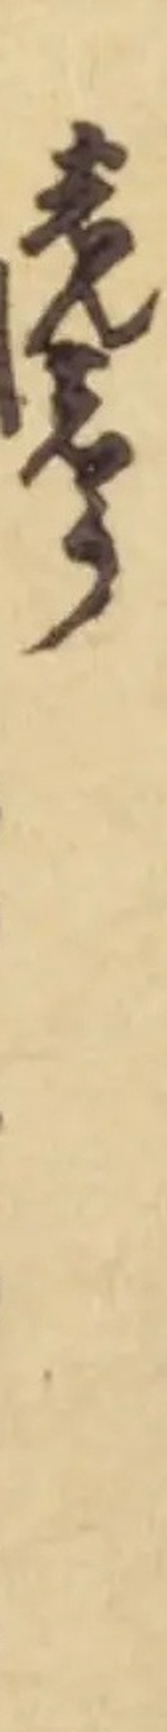しんしう
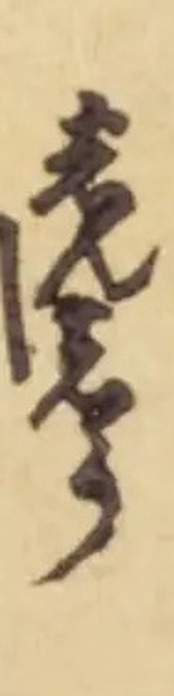しんしう
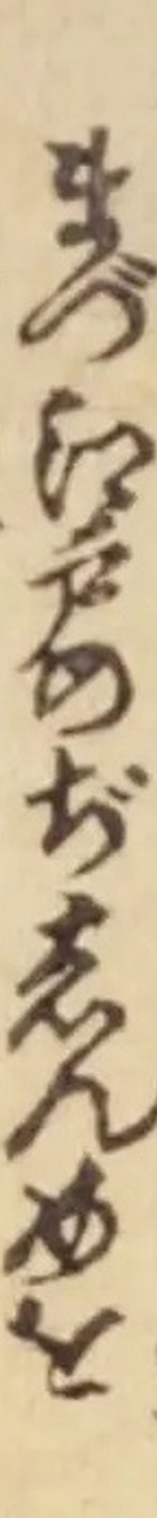まづ江戸のぢしんめを
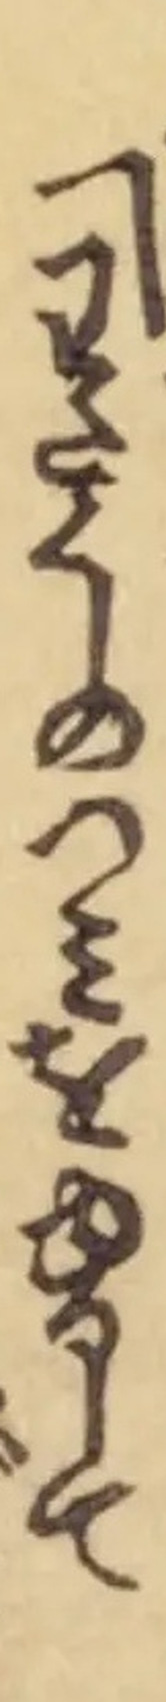「わたくしのつみをゆるして
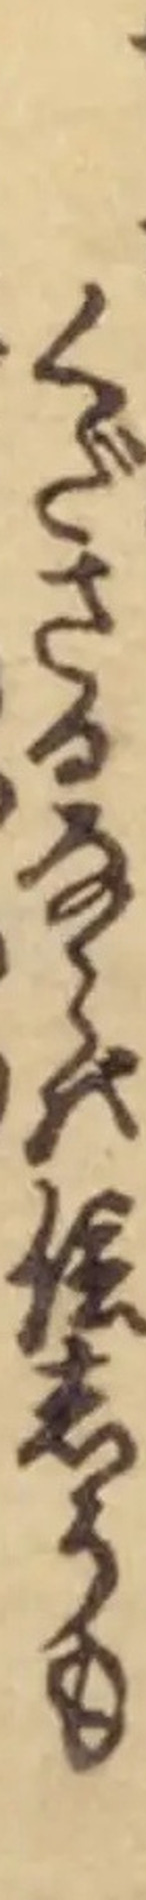くださるならば信しうも
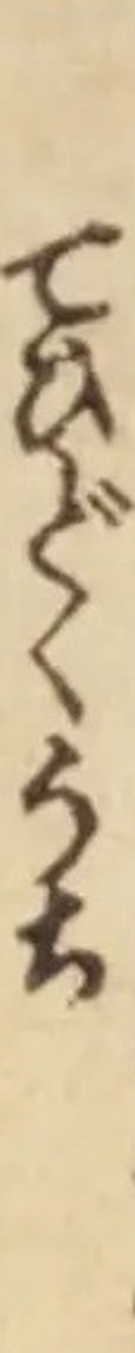てひどくうち
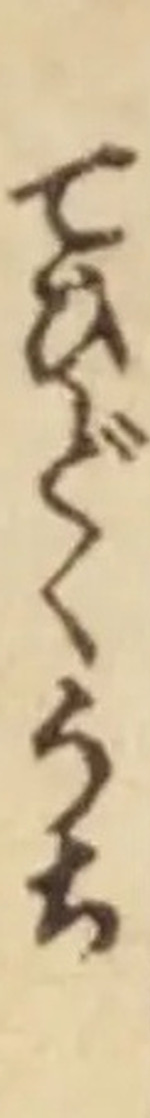てひどくうち
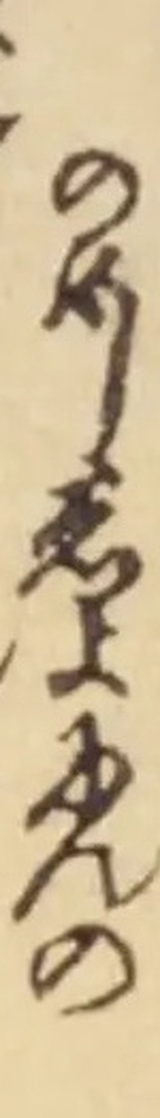のめししよにんの
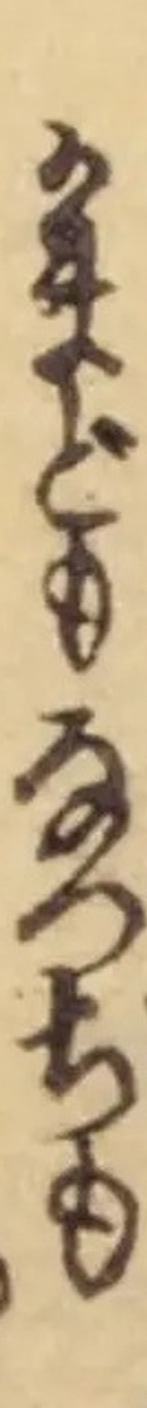かまどもなつちも
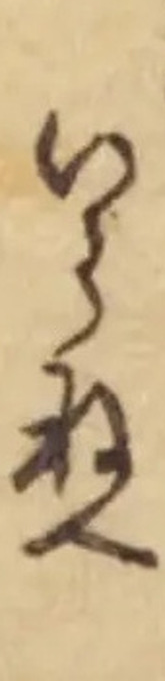いらねへ
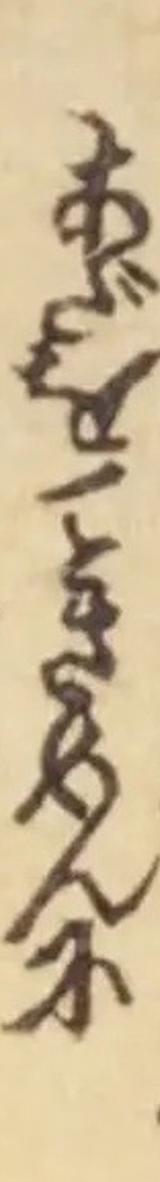あだをてきめんに
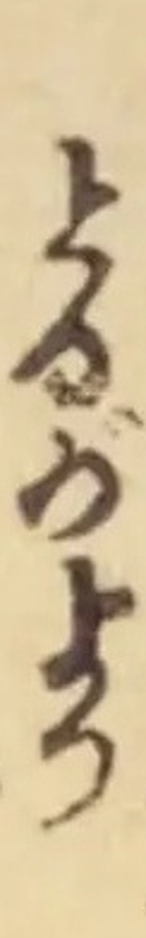とるがよか
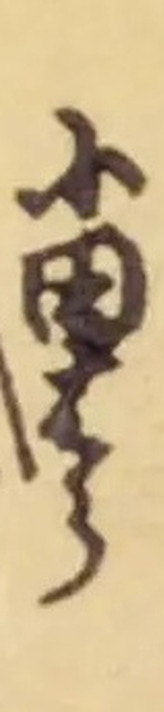小田はら
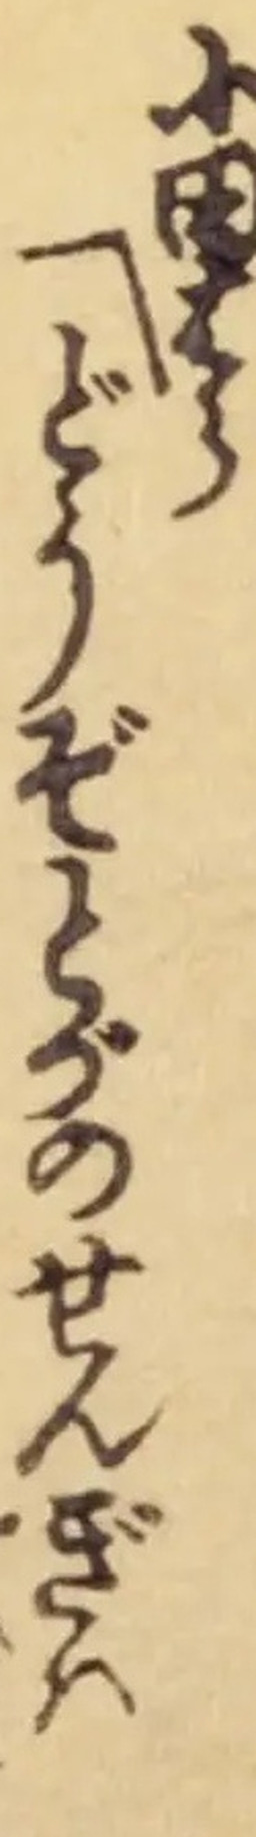「どうぞとがのせんぎは
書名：（地震鯰の取調べ）
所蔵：国立国会図書館 National Diet Library, JAPAN
